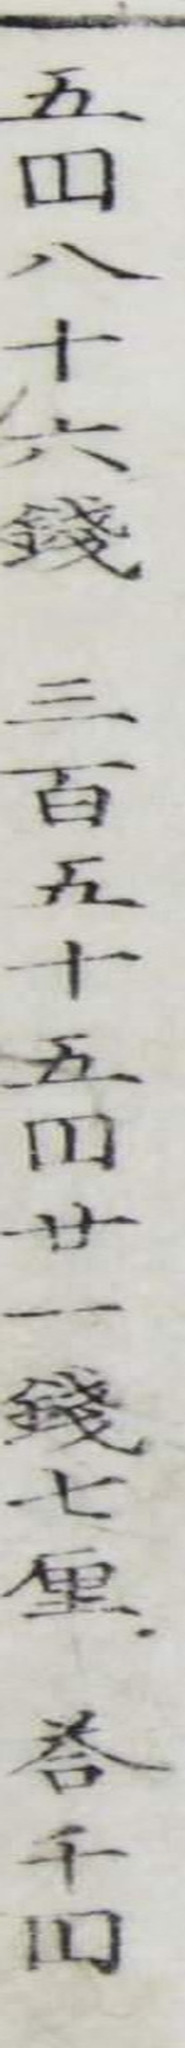五円八十六銭、三百五十五円廿一銭七厘、答千円

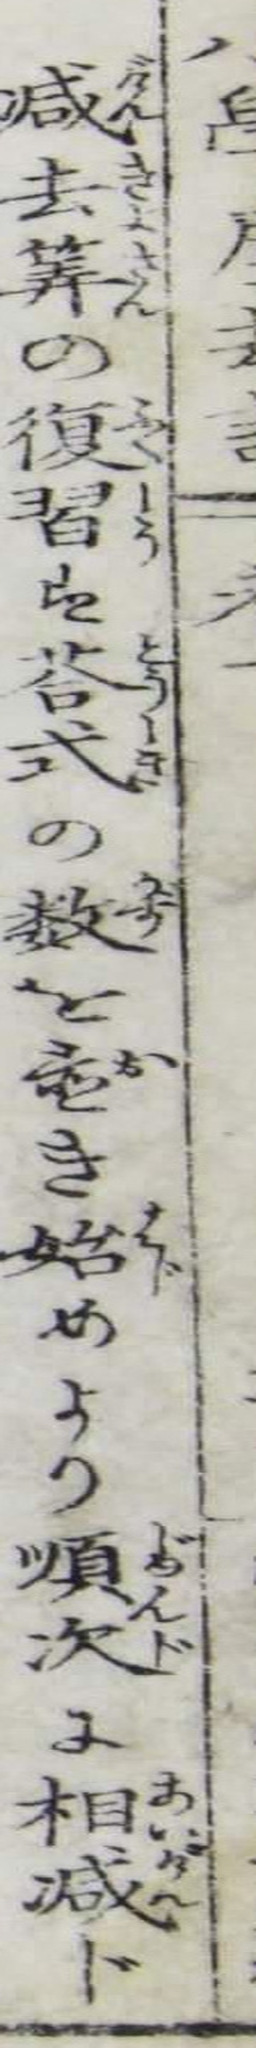減去算の復習は答式の数を置き始めより順次に相減じ
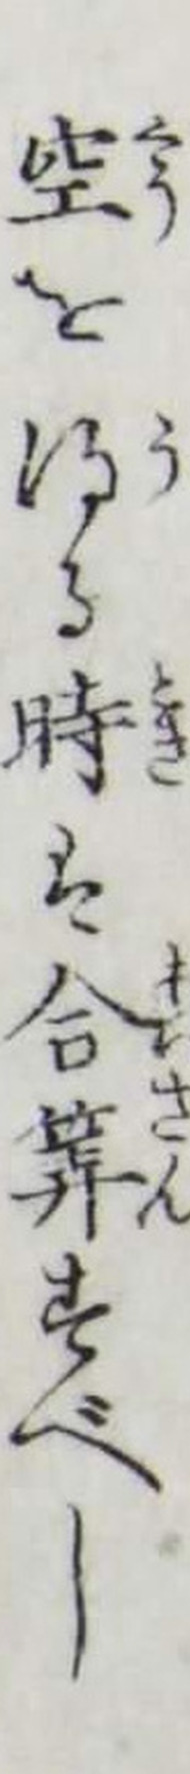空を得る時は合算すべし
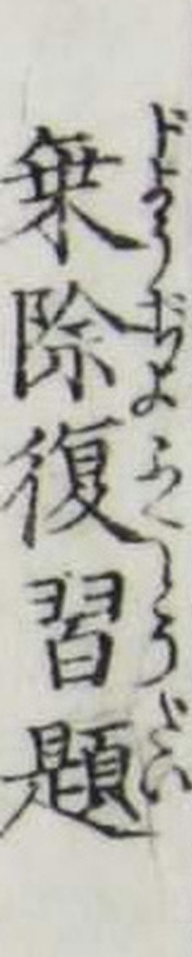乗除復習題
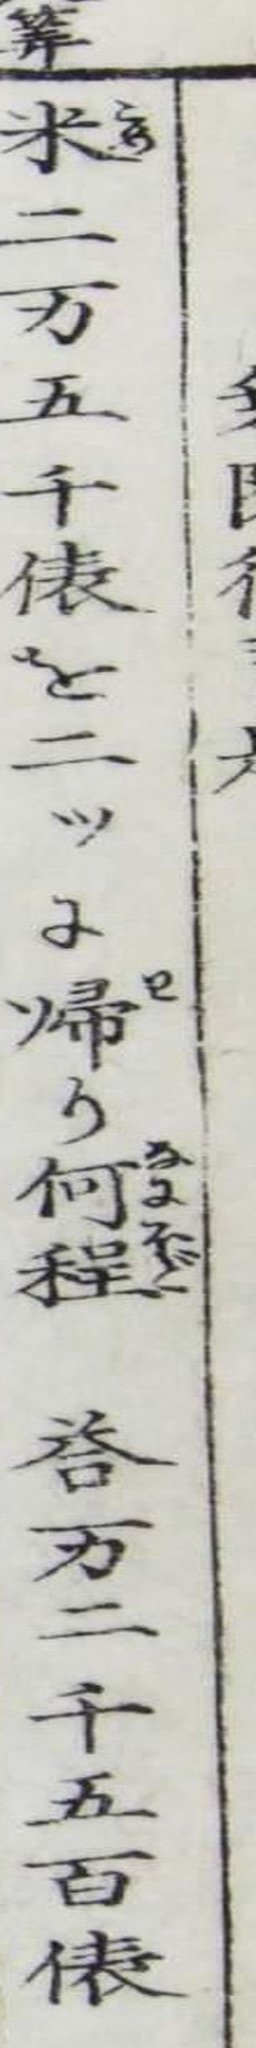米二万五千俵を二ツに帰り何程答万二千五百俵
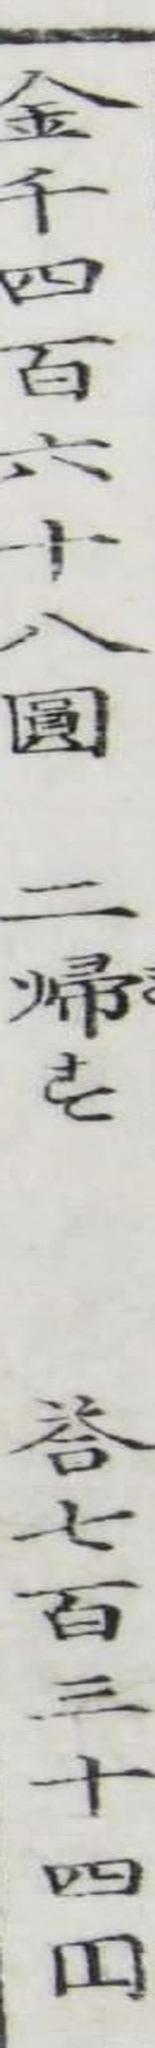金千四百六十八円二帰す答七百三十四円
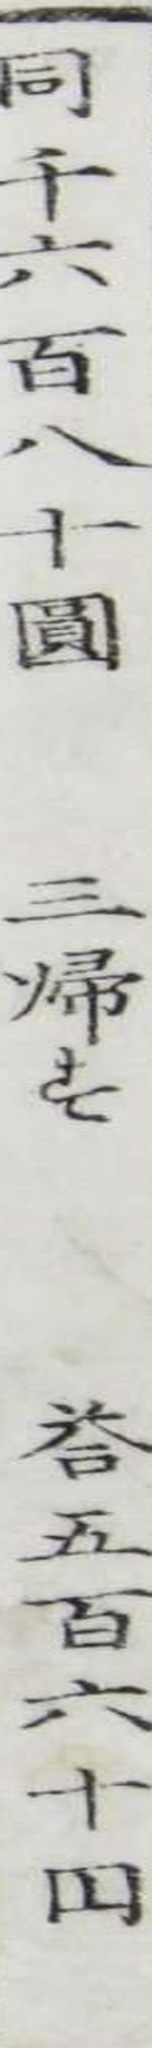同千六百八十円三帰す答五百六十円
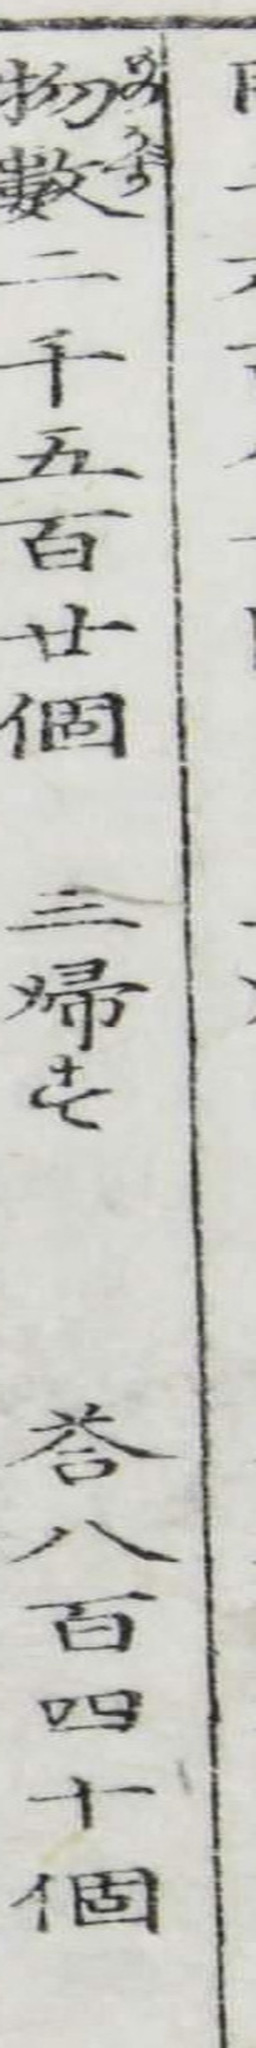物数二千五百廿個三帰す答八百四十個
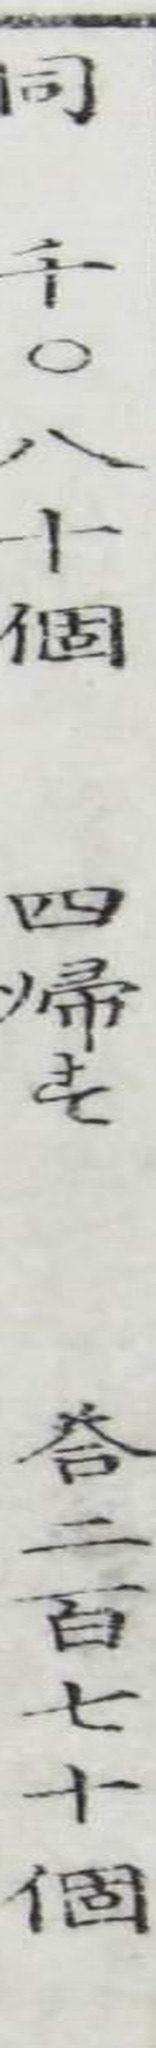同千〇八十個四帰す答二百七十個
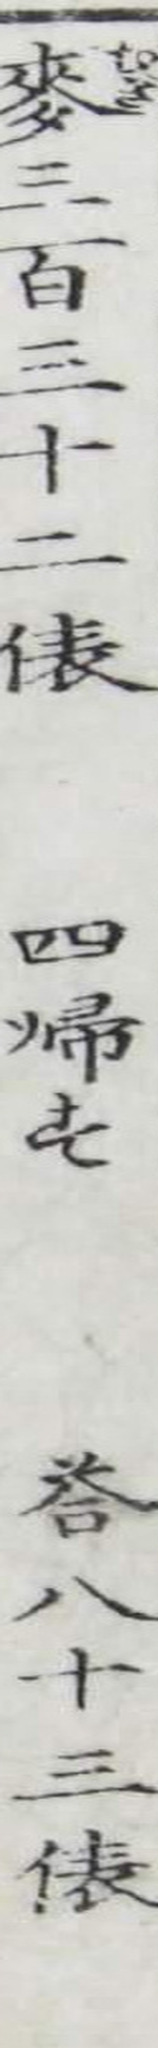麦三百三十二俵四帰す答八十三俵
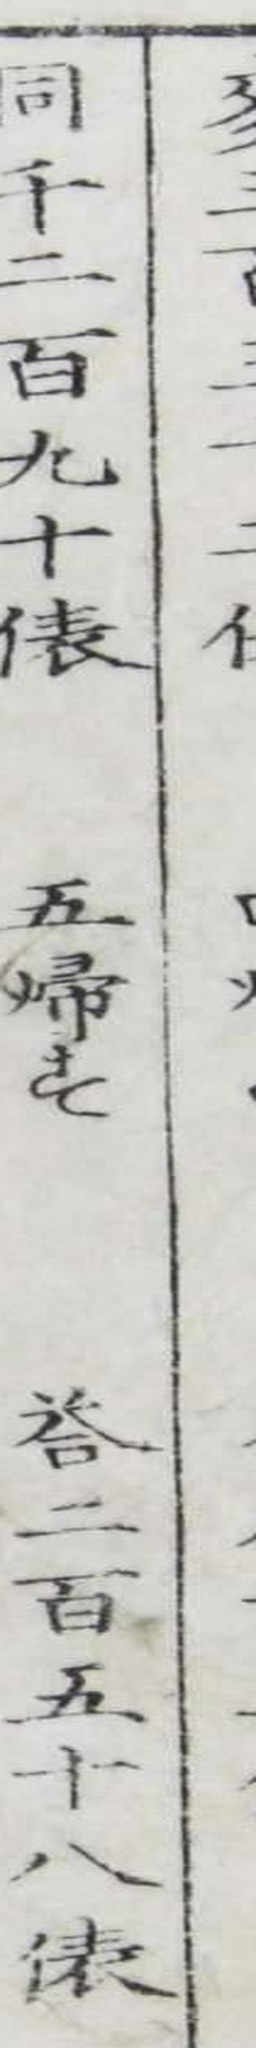同千二百九十俵五帰す答二百五十八俵
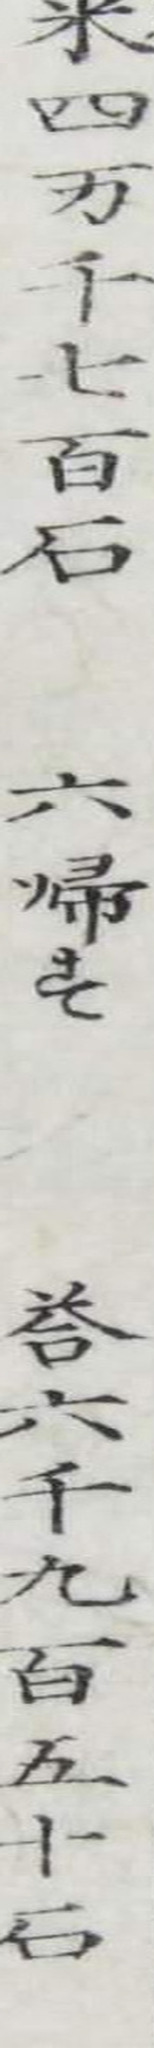米四万千七百石六帰す答六千九百五十石
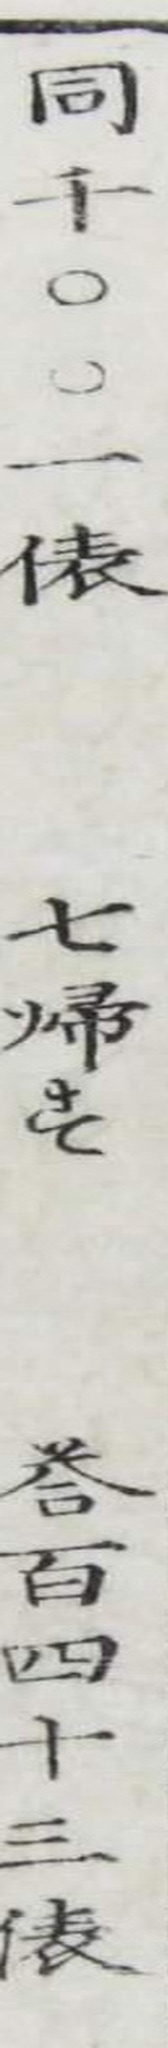同千〇〇一俵七帰す答百四十三俵
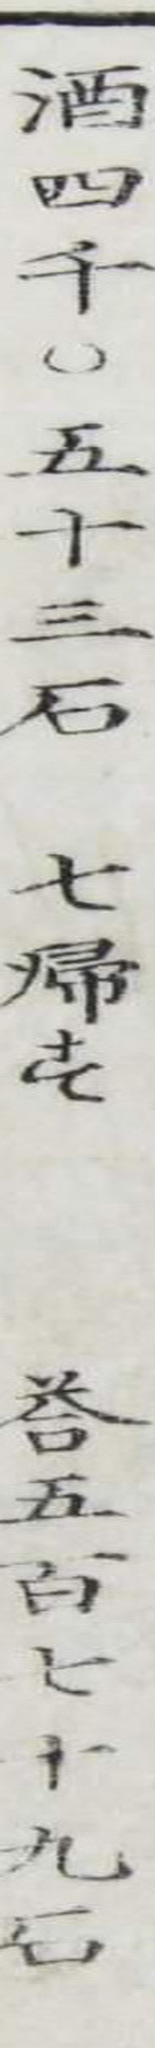酒四千〇五十三石七帰す答五百七十九石
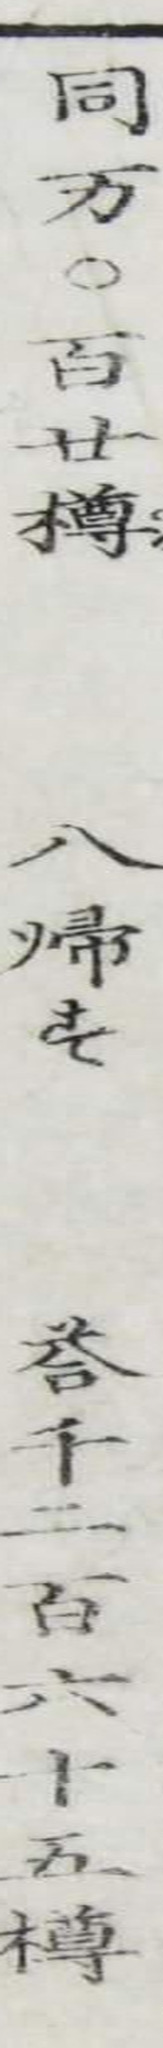同万百廿樽八帰す答千二百六十五樽
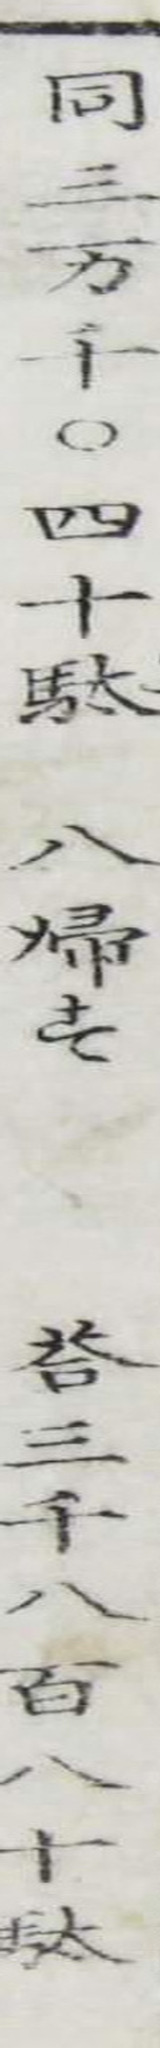同三万千〇四十駄八帰す答三千八百八十駄
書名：明治小學塵劫記 卷1
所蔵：東京学芸大学教育コンテンツアーカイブ
